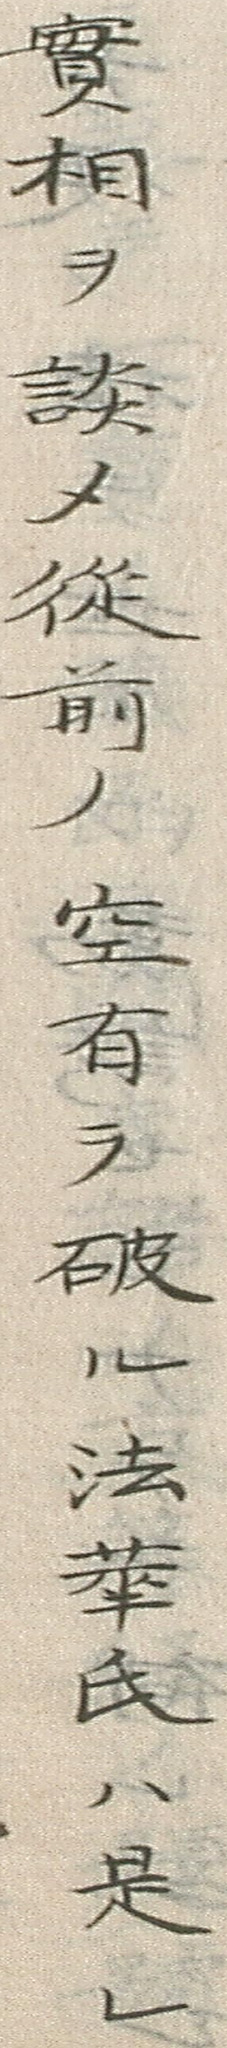実相ヲ談シテ従前ノ空有ヲ破ル法華氏ハ是レ
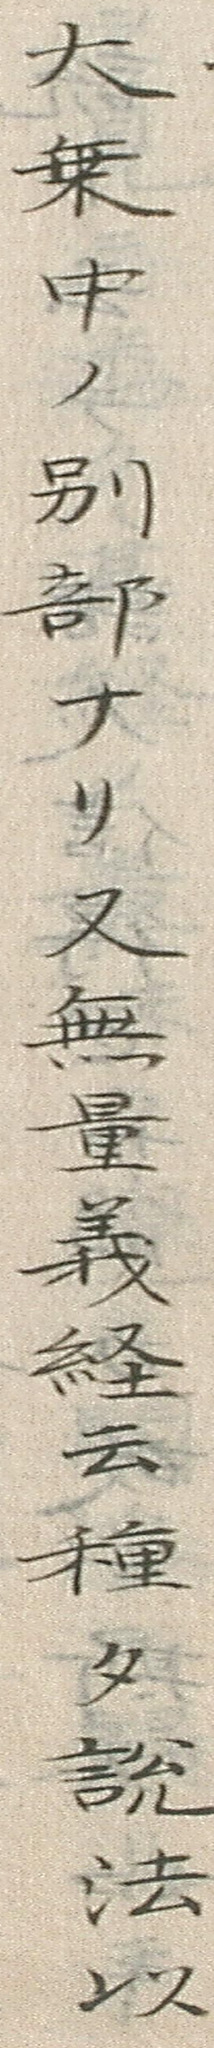大乗中ノ別部ナリ又無量義経云種々説法以
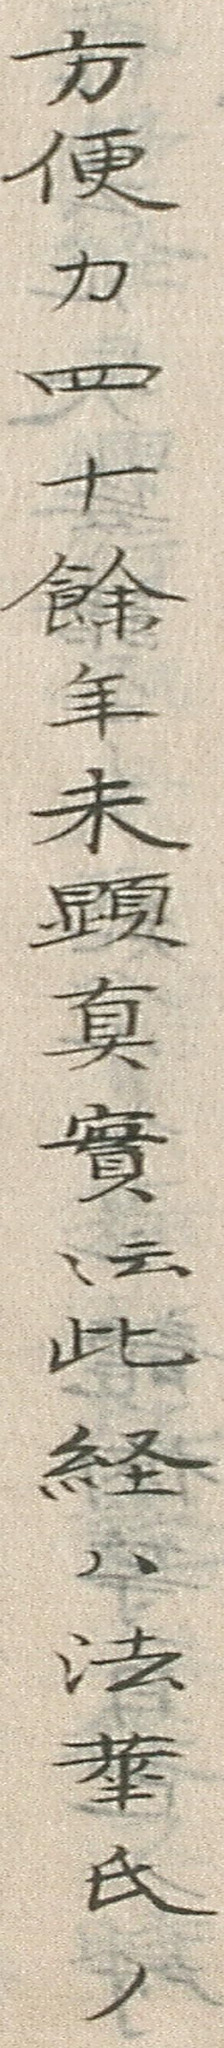方便カ四十余年未顕真実云〻此経ハ法華氏ノ
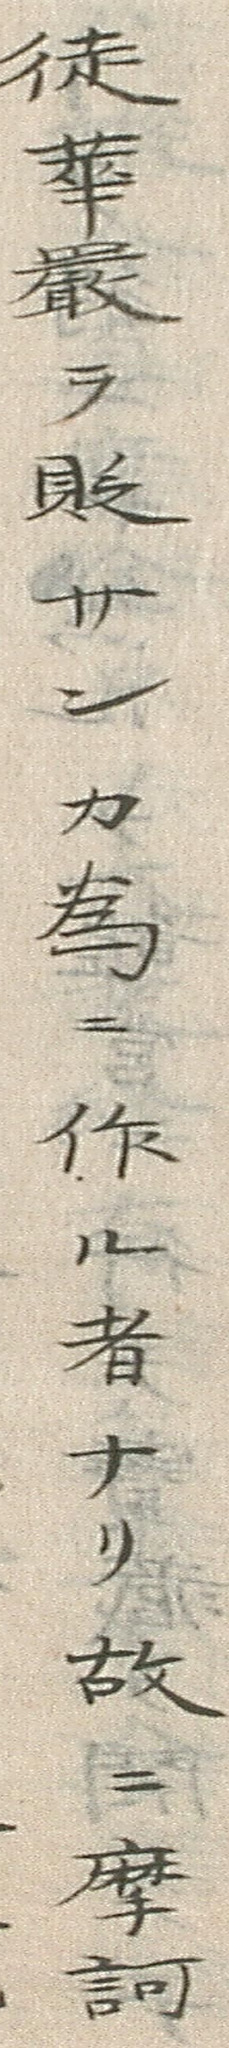徒華厳ヲ貶サンカ為ニ作ル者ナリ故ニ摩訶
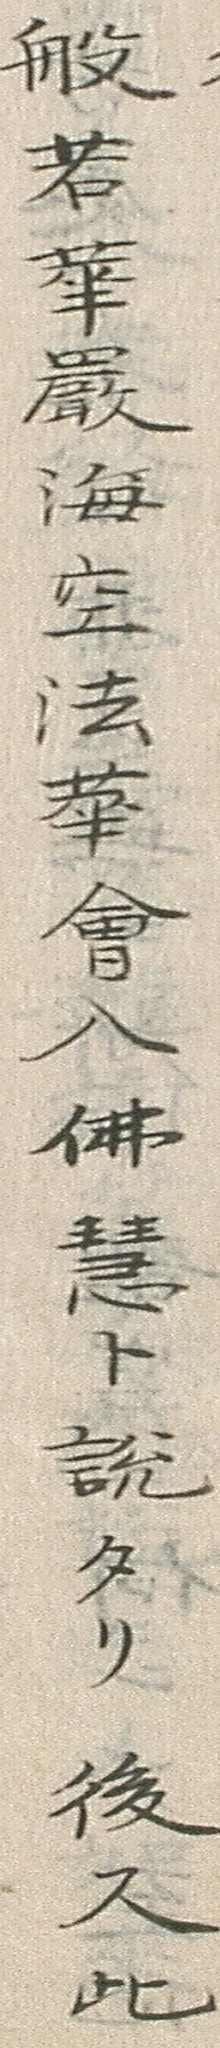般若華厳海空法華会入仏慧ト説タリ後人此
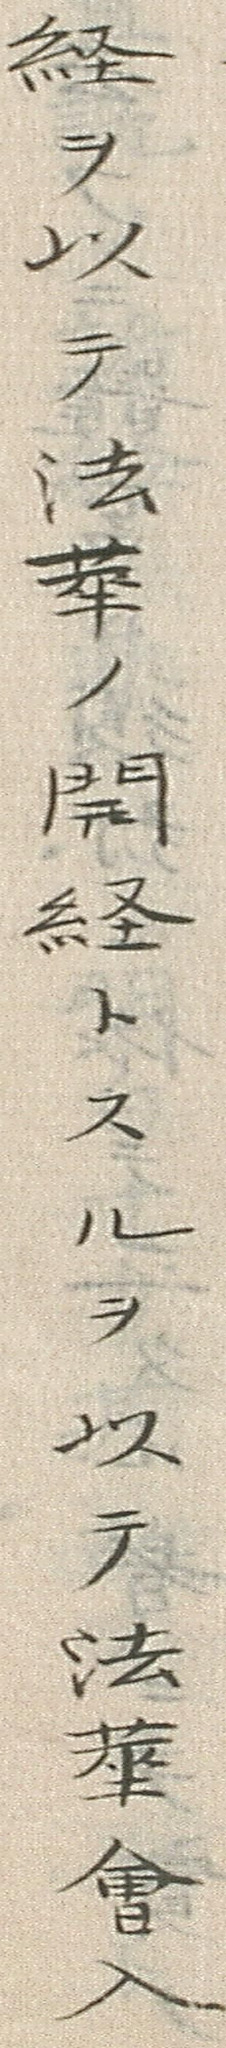経ヲ以テ法華ノ開経トスルヲ以テ法華会入
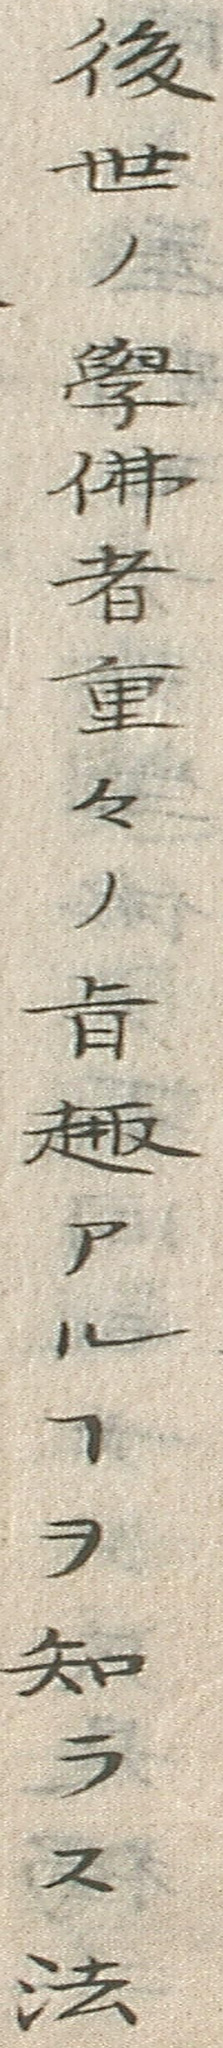後世ノ学仏者重々ノ旨趣アルコトヲ知ラス法
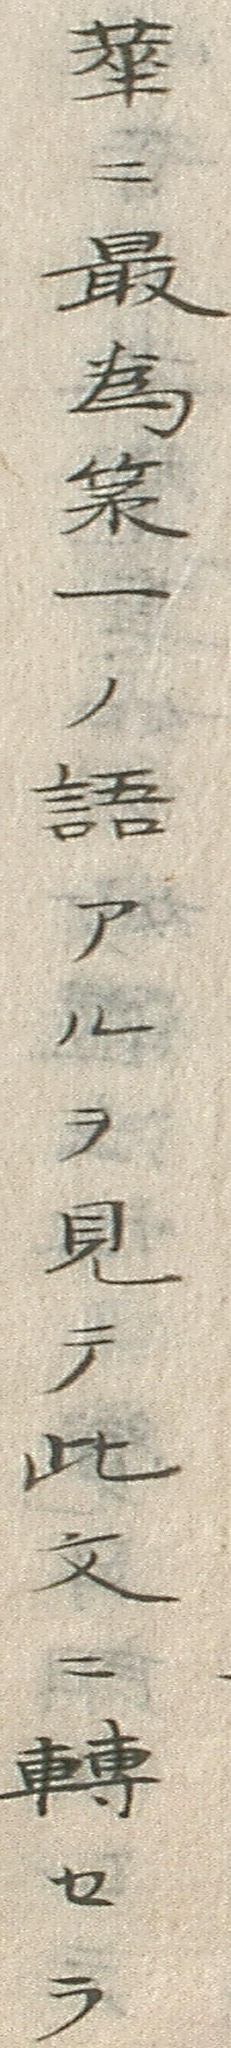華ニ最為第一ノ語アルヲ見テ此文ニ転セラ
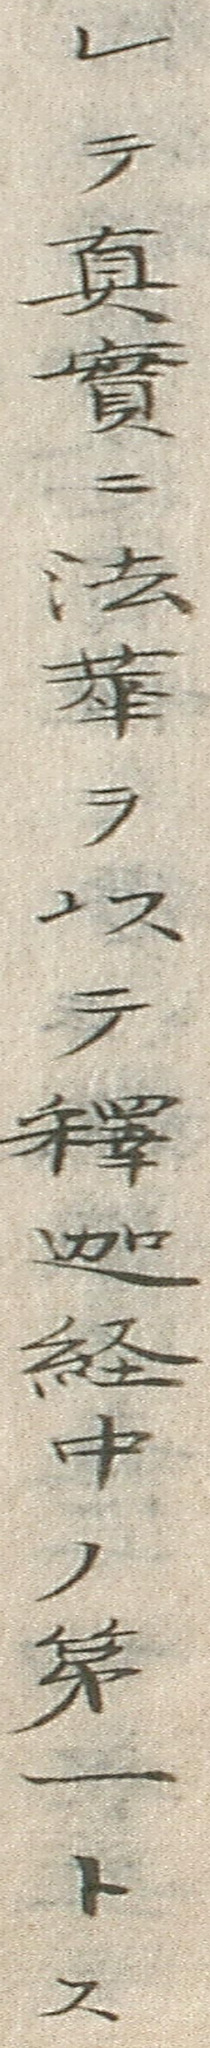レテ真実ニ法華ヲ以テ釈迦経中ノ第一トス
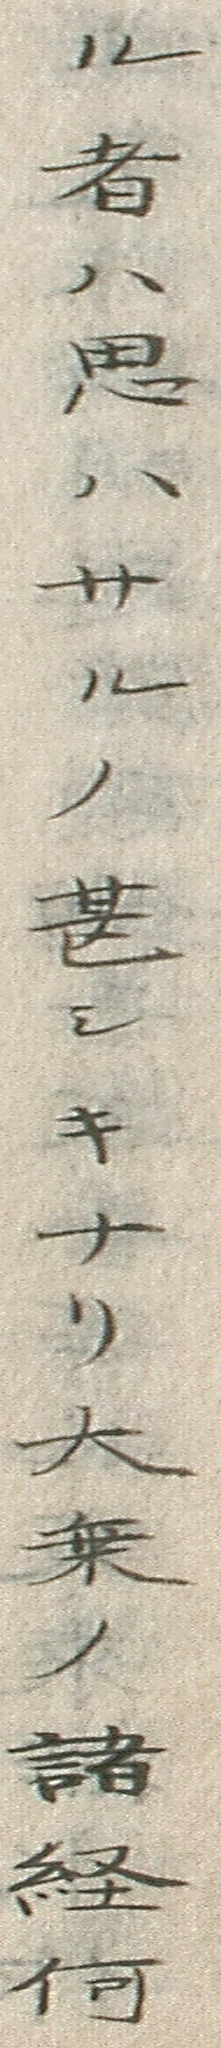ル者ハ思ハサルノ甚シキナリ大乗ノ諸経何
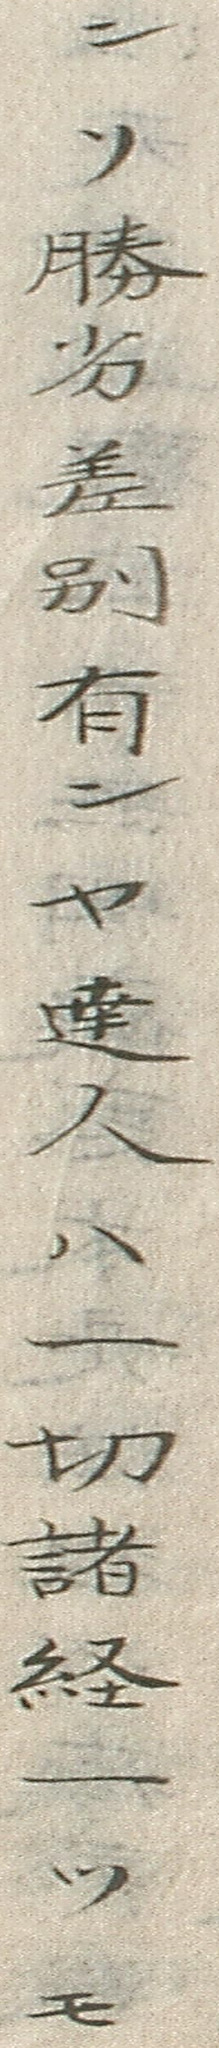ンソ勝劣差別有ンヤ達人ハ一切諸経一ッモ
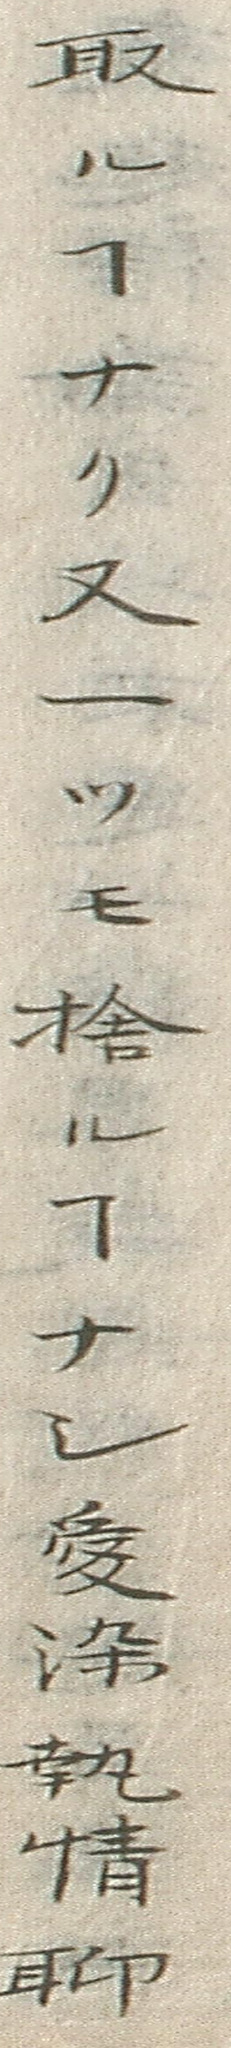取ルコトナク又一ッモ捨ルコトナシ愛染執情聊
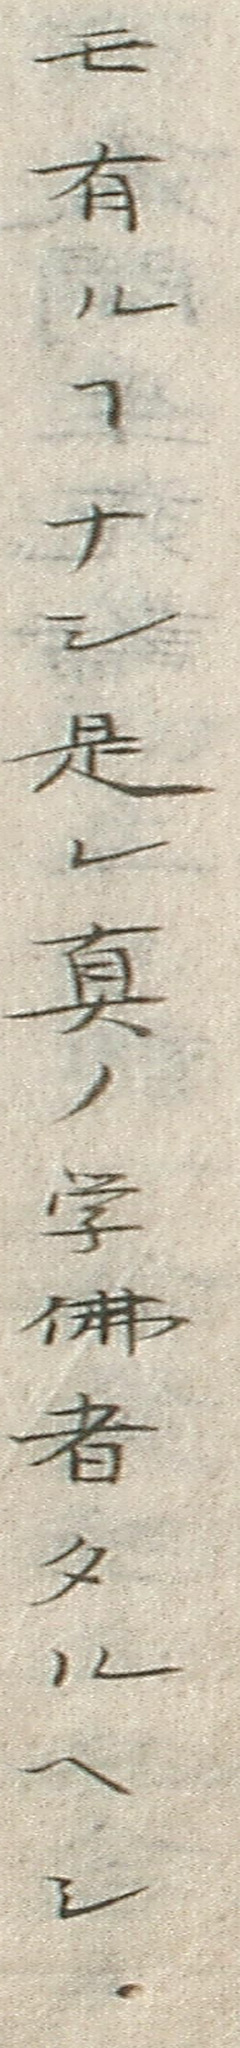モ有ルコトナシ是レ真ノ学仏者タルヘシ

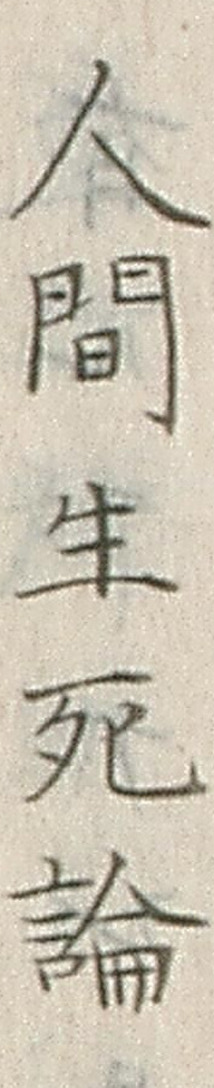人間生死論
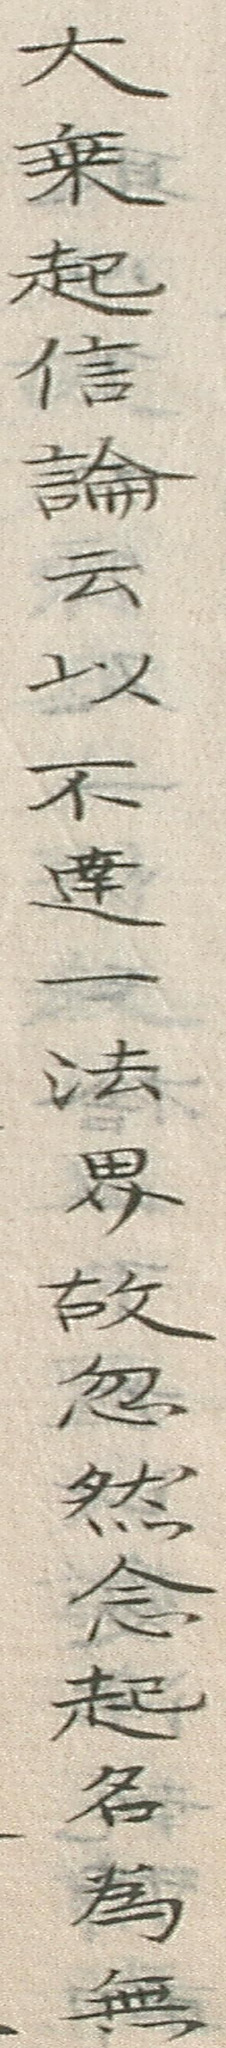大乗起信論云以不達一法界故忽然念起名為無
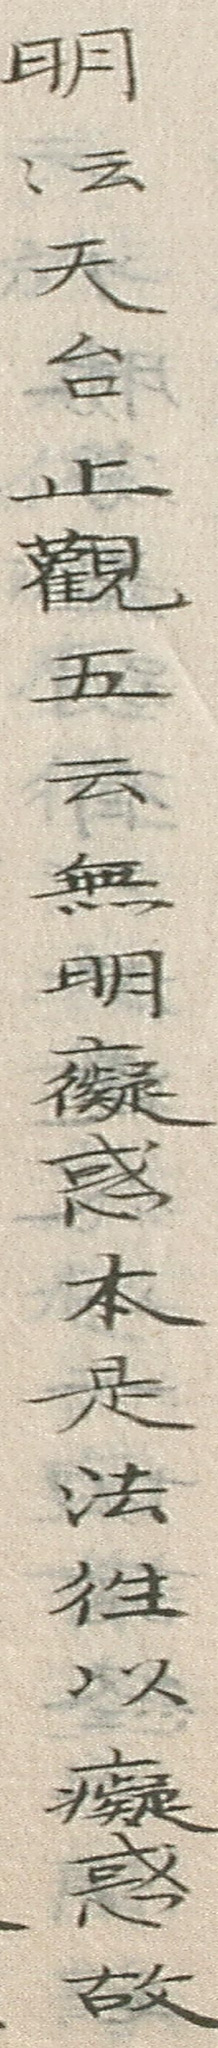明云〻天台止観五云無明癡惑本是法性以癡惑故
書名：天學略名目羽翼　全
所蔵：東京大学地震研究所図書室 Earthquake Research Institute Library, The University of Tokyo, JAPAN
